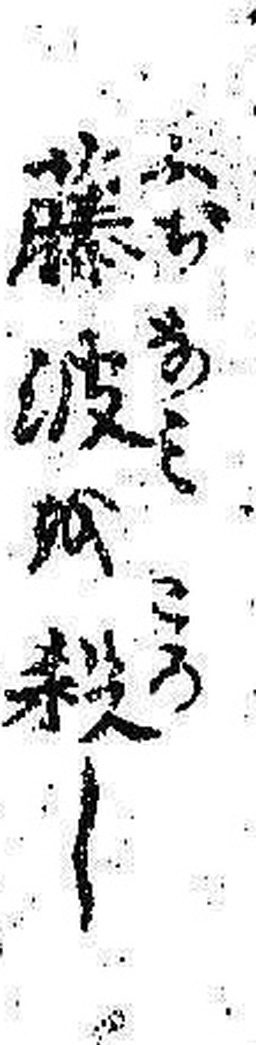藤波を殺し
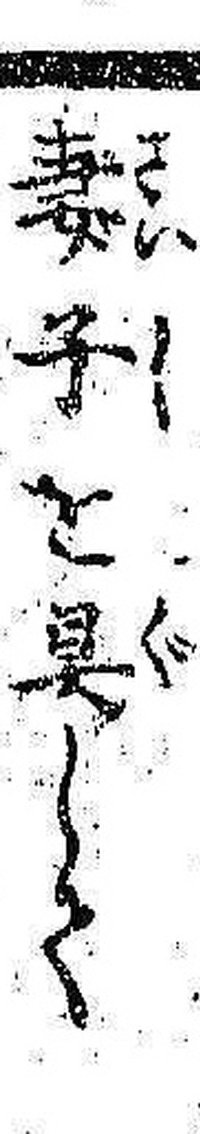妻子を具して
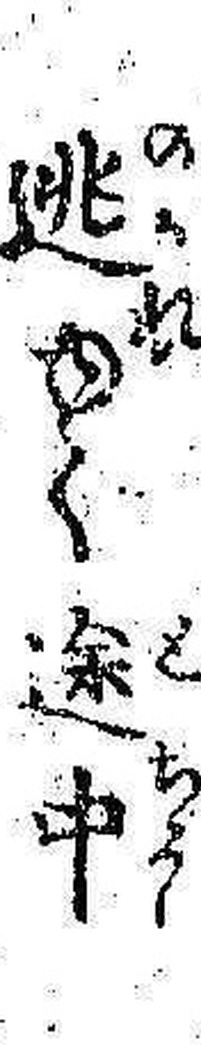逃ゆく途中
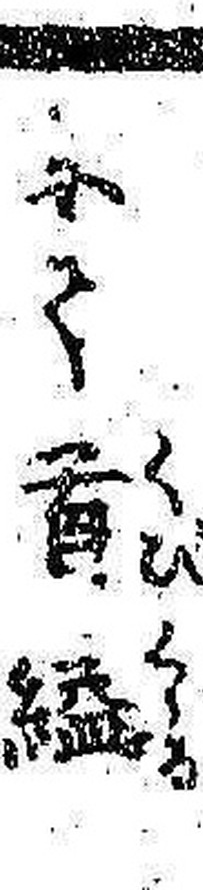にて首縊
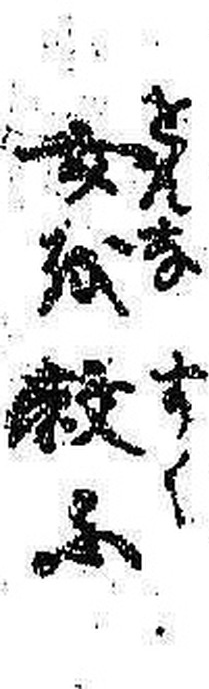女を救ふ
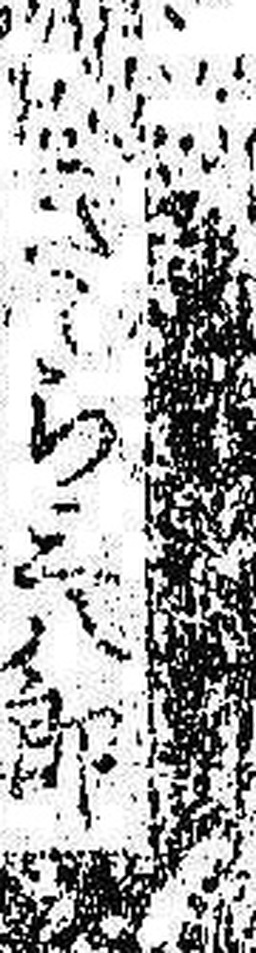さゝら三八郎

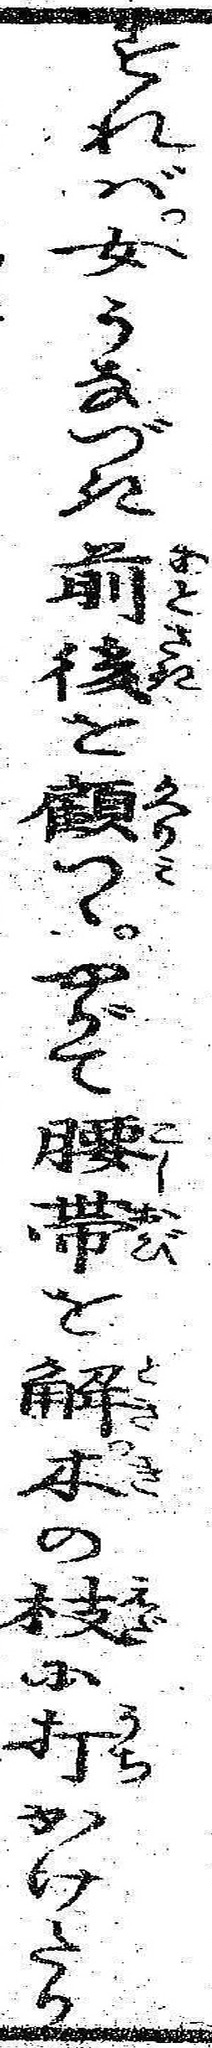すれば。女うなづき前後を顧つゝ。やがて腰帯を解。木の枝に打かけたり
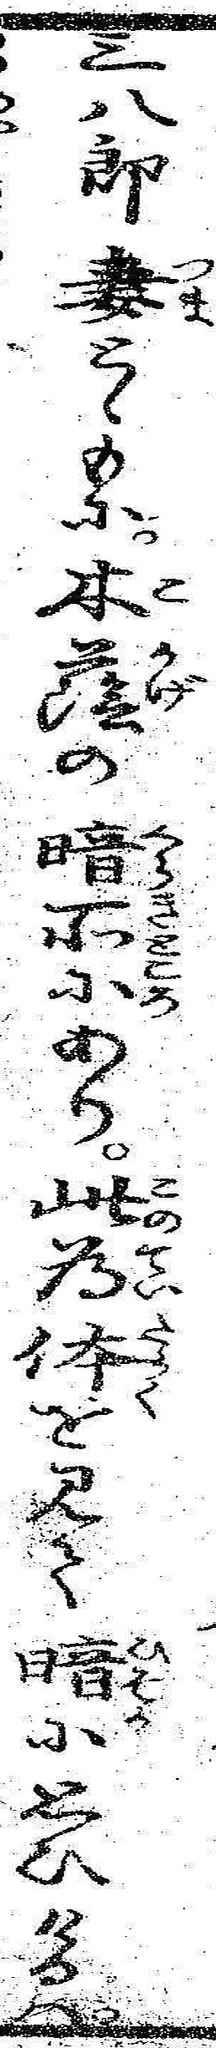三八郎妻とゝもに。木蔭の暗所にあり。此為体を見て暗に思ひけるは。
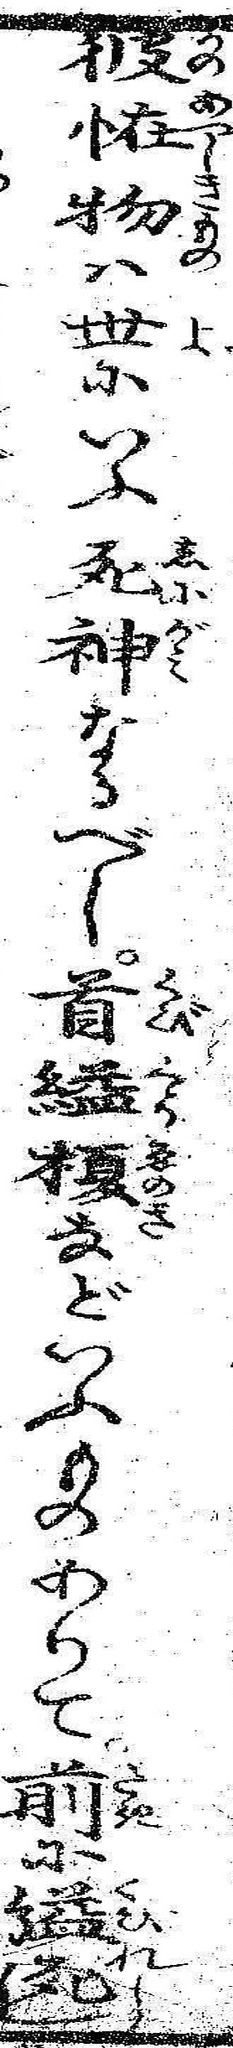彼怪物は世にいふ死神なるべし。首縊榎などいふものありて。前に縊死し
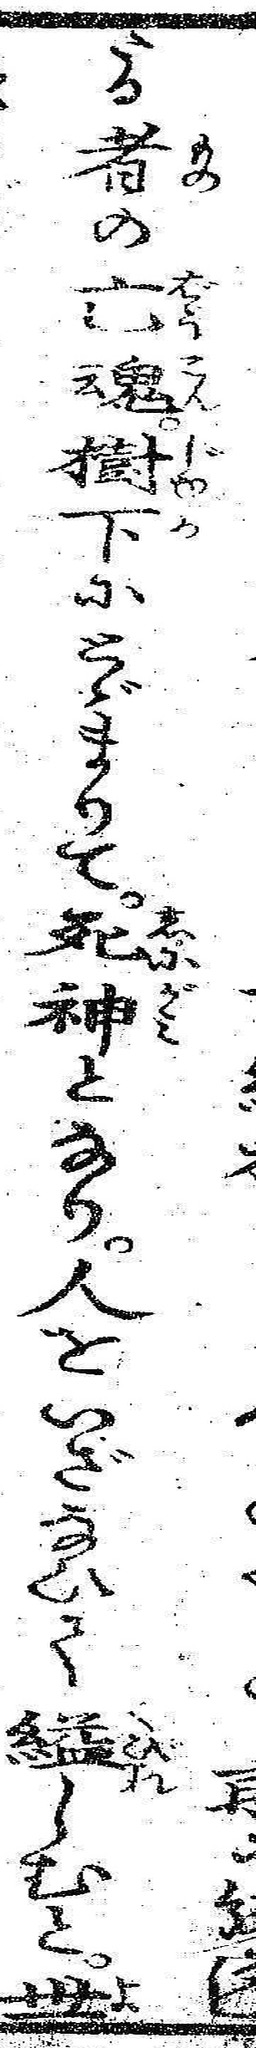たる者の亡魂。樹下にとゞまりて。死神となり。人をいざなひて縊しむと。世
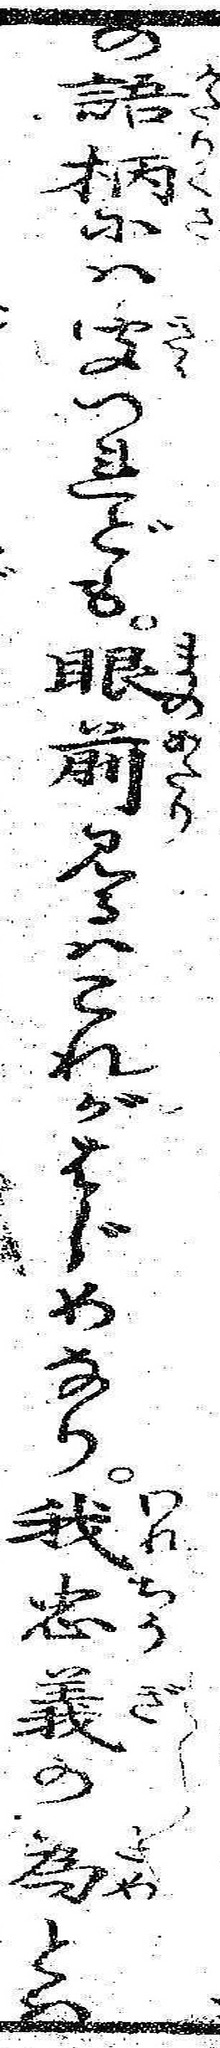の語柄には聞つれども。眼前見るはこれがはじめなり。我忠義の為とは
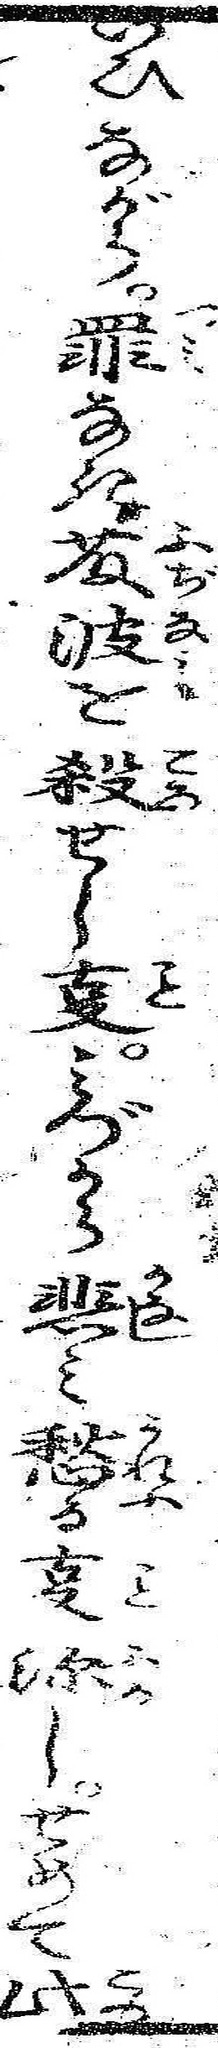いひながら。罪なき藤波を殺せし事。みづから悲み愁る事深し。せめて此
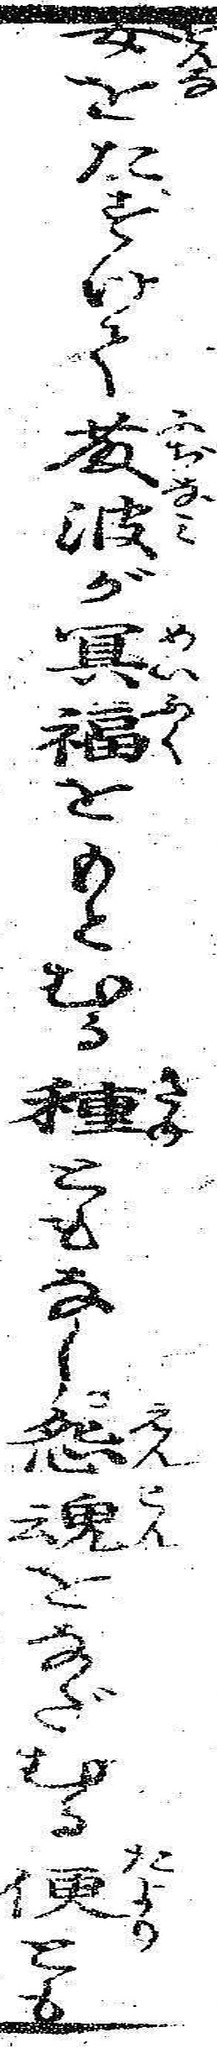女をたすけて藤波が冥福をもとむる種ともなし。怨魂をなだむる便とも
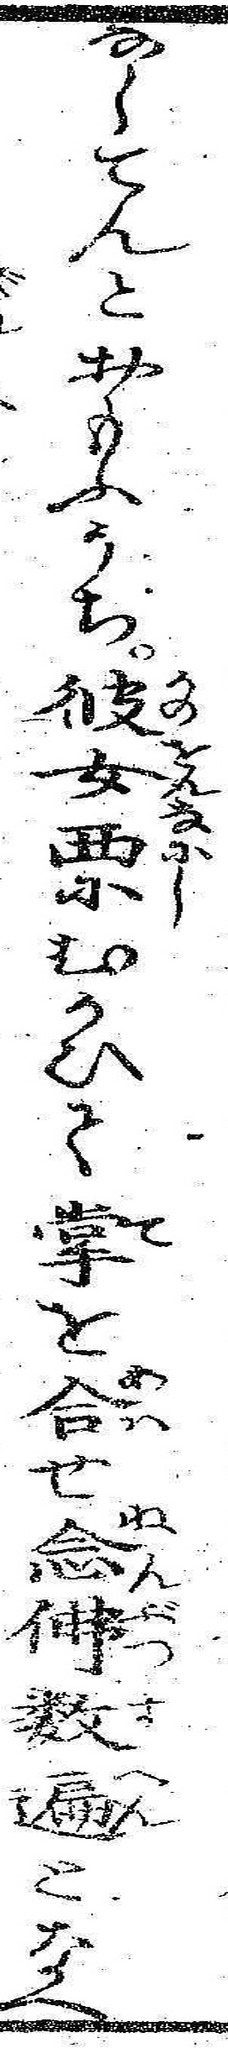なしてんとおもふうち。彼女西にむかひて掌を合せ念仏数遍となへ
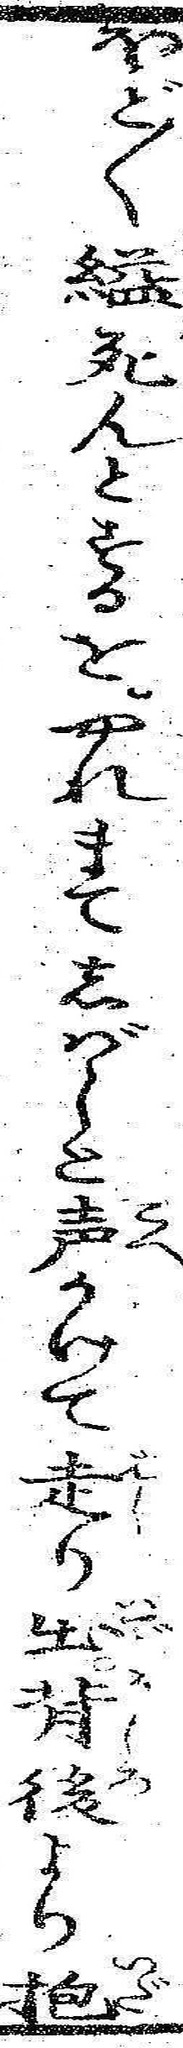ほど〳〵縊死んとするを。やれまてしばしと声かけて走り出。背後より抱
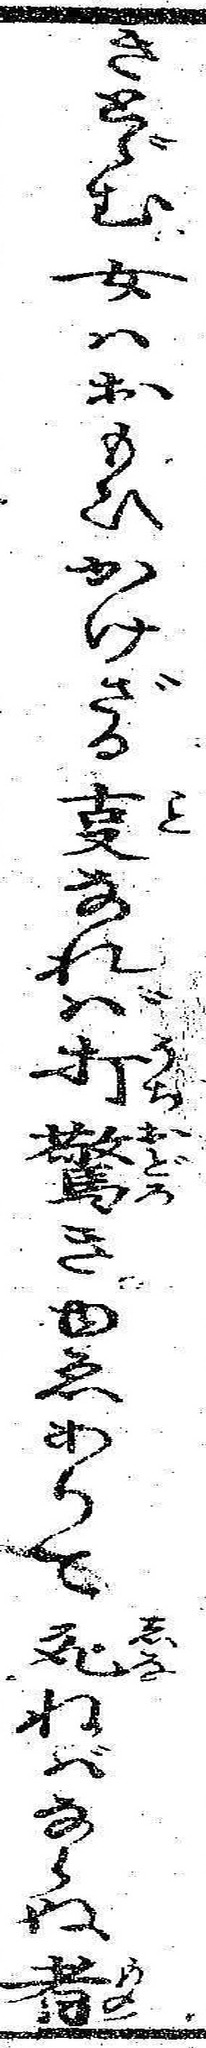きとゞむ。女はおもひかけざる事なれば打驚。ゆゑありて死ねばならぬ者
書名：昔話稲妻表紙
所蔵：国文学研究資料館
